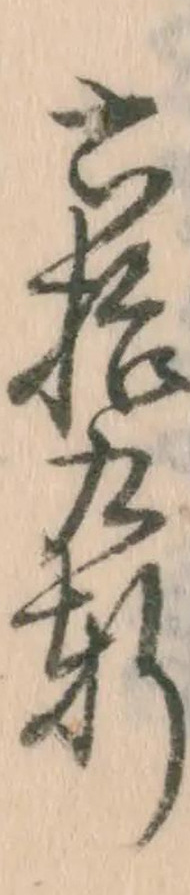六拾九軒
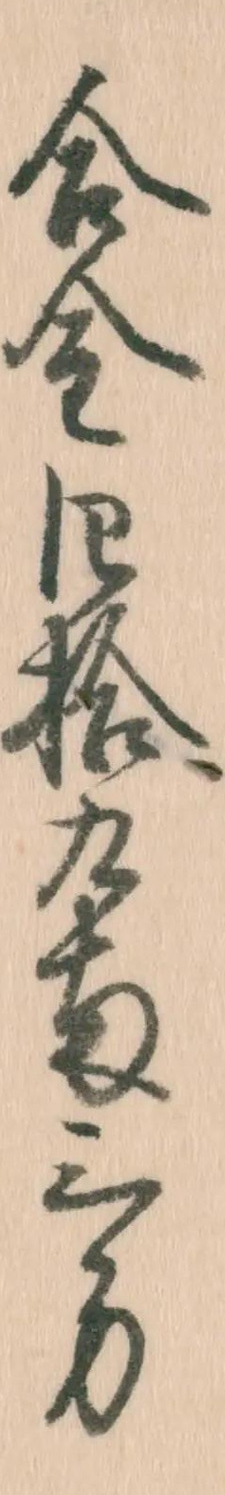合金四拾九両三分
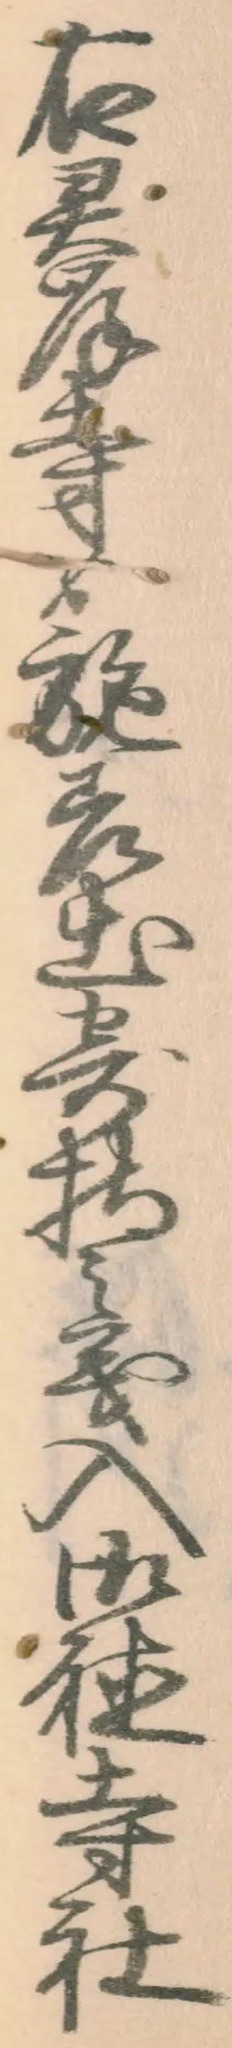右霊岸寺ゟ施差出奇特之義入御聴寺社
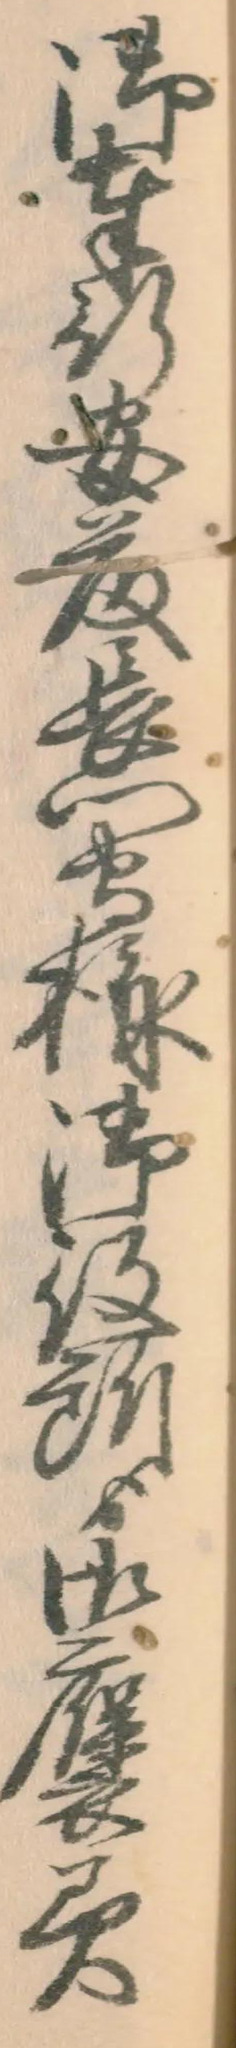御奉行安藤長門守様御役所ゟ御褒美
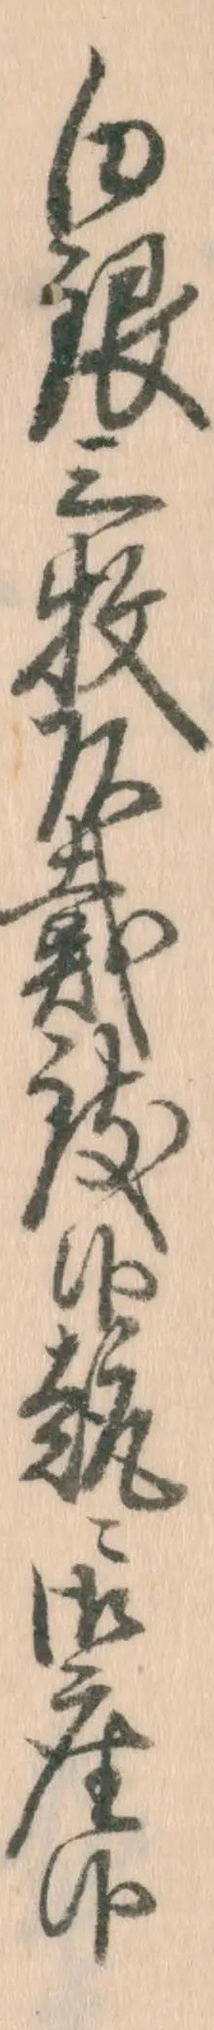白銀三枚頂戴致候趣ニ御座候
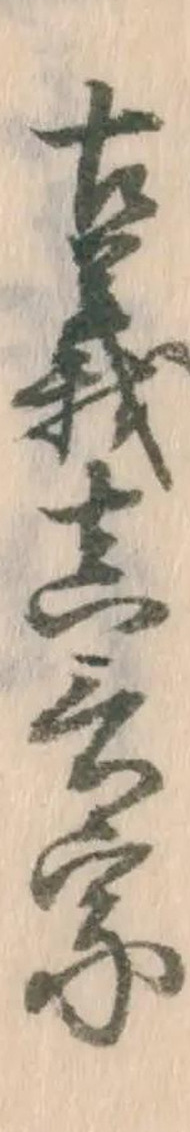古義真言宗
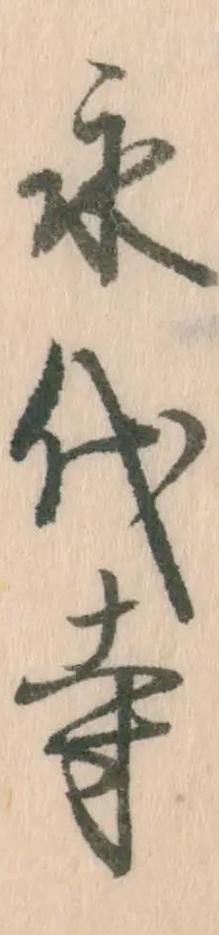永代寺

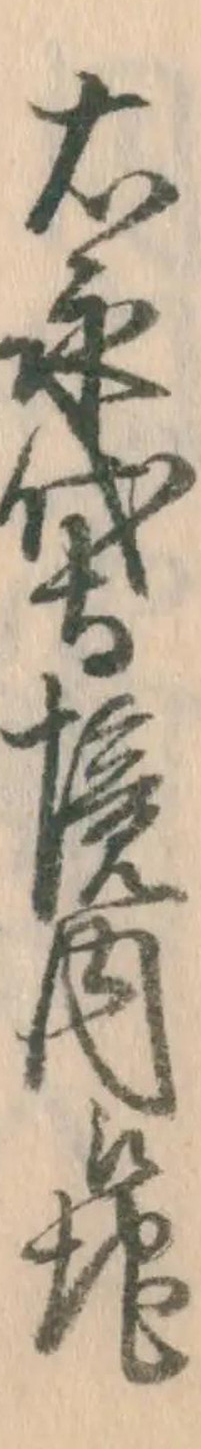右永代寺境内え地
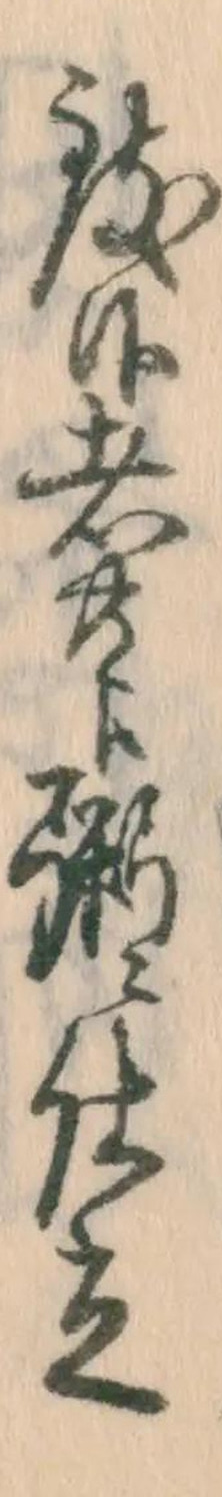致候者共え粥ニ仕立
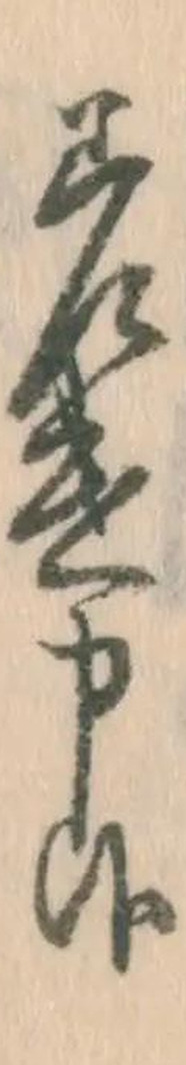差遣申候
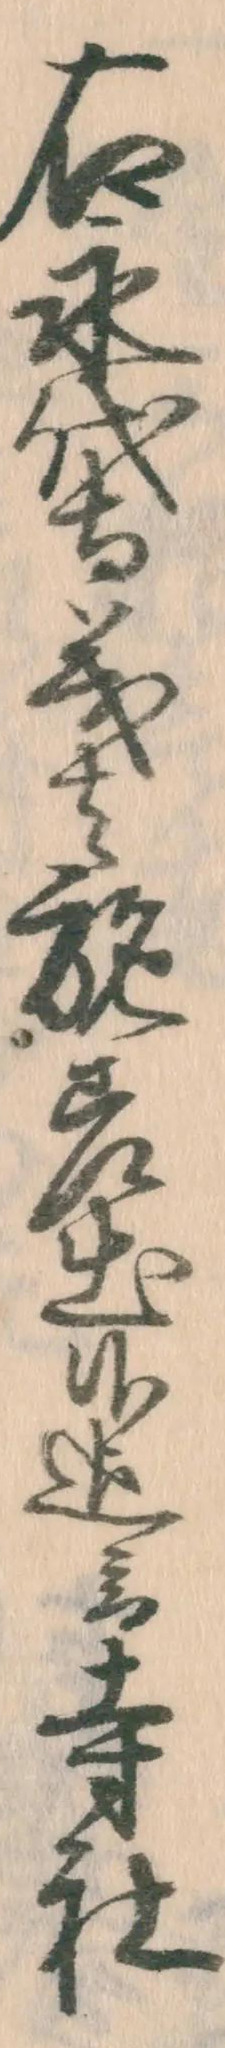右永代寺義は施差出候迄ニ而寺社
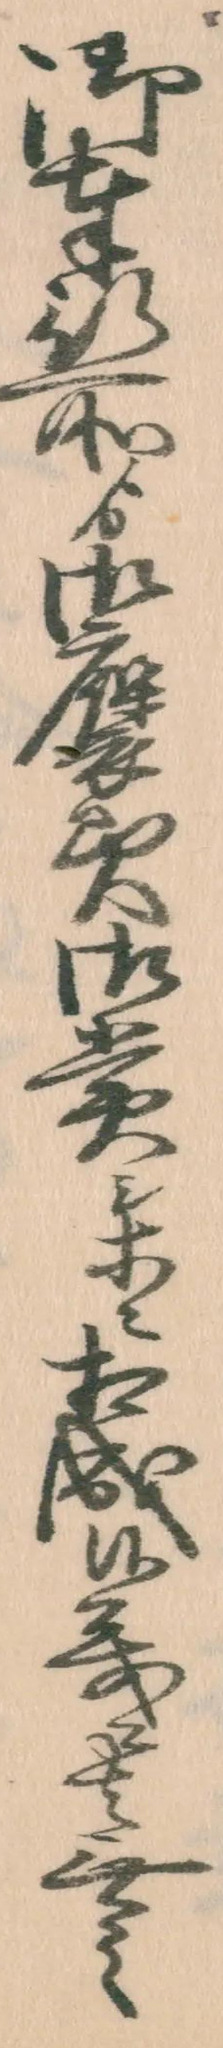御奉行所ゟ御褒美御賞シ等ニ相成候義ニは無之
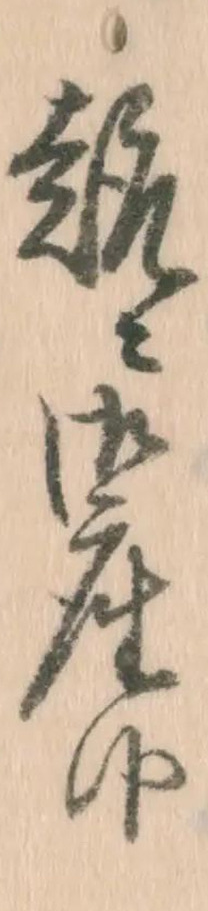趣ニ御座候
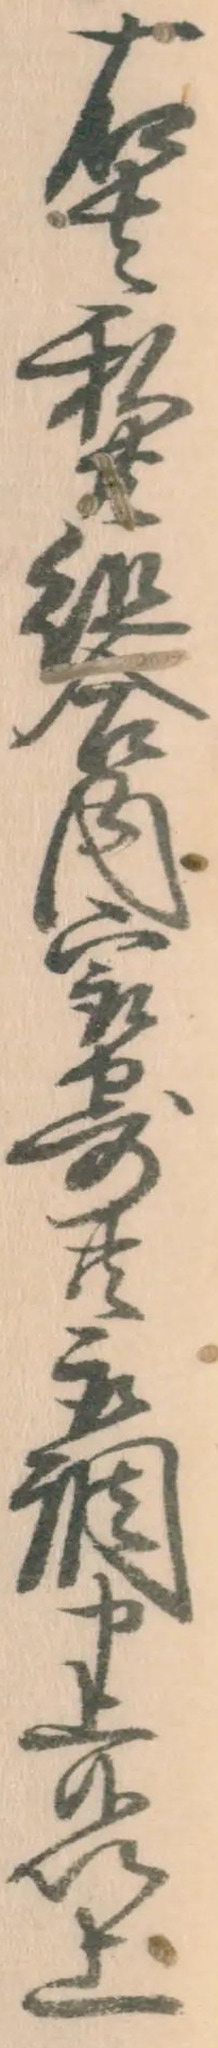右は私共組合内最寄共取調申上候以上
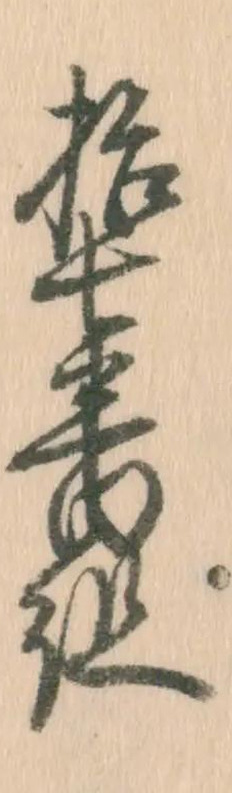拾七番組
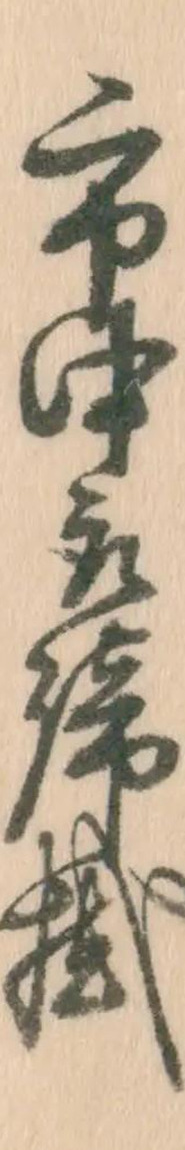市中取締掛
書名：武家方并寺院等ニテ施差出候一件
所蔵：国立国会図書館 National Diet Library, JAPAN
